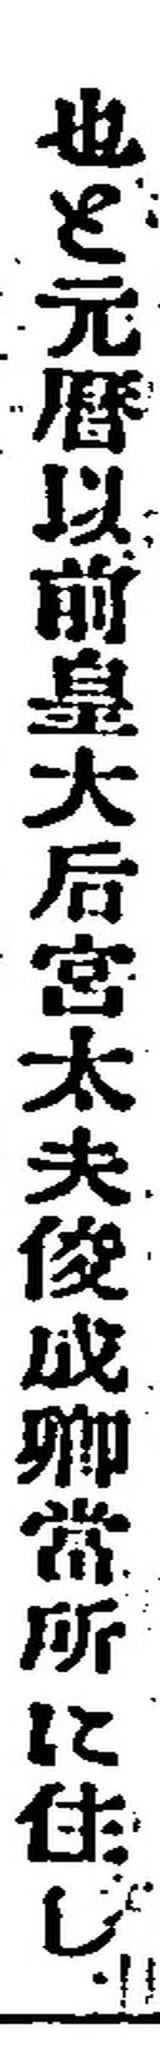也と元暦以前皇大后宮太夫俊成卿当所に住し
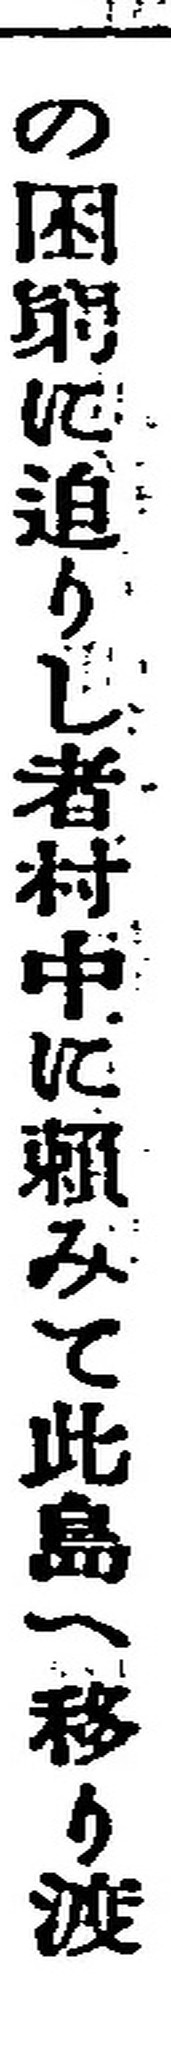の困窮に迫りし者村中に頼みて此島へ移り渡
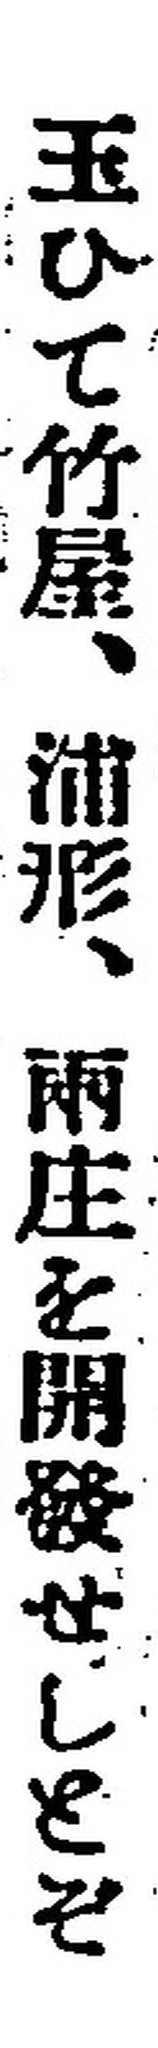玉ひて竹屋、浦形、両庄を開発せしとぞ
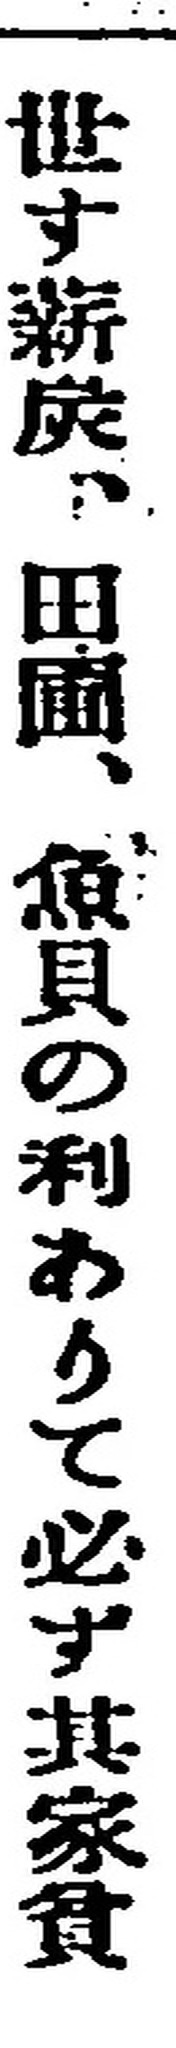世す薪炭、田圃、魚貝の利ありて必ず其家貧
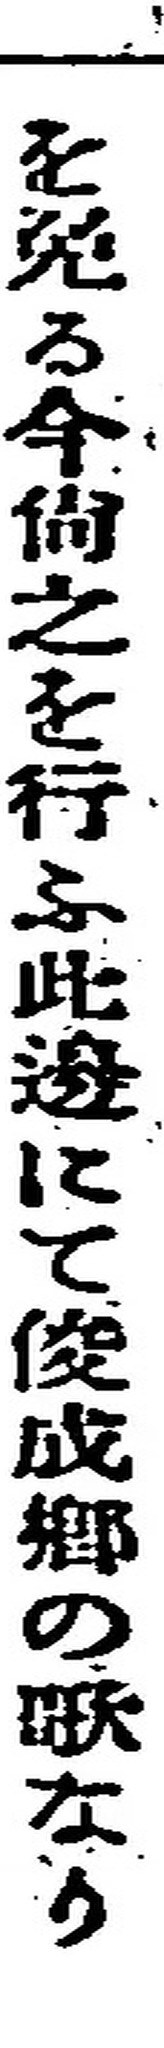を免る今尚之を行ふ此辺にて俊成郷の歌なり
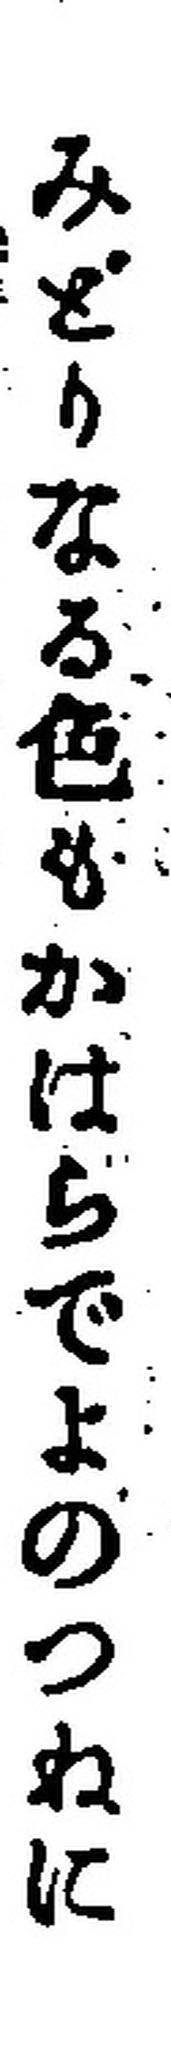みどりなる色もかはらでよのつねに
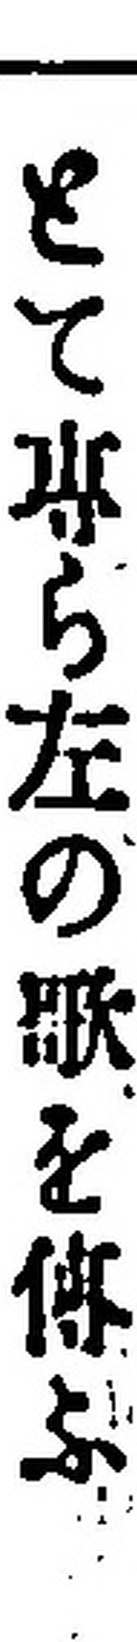とて専ら左の歌を伝ふ
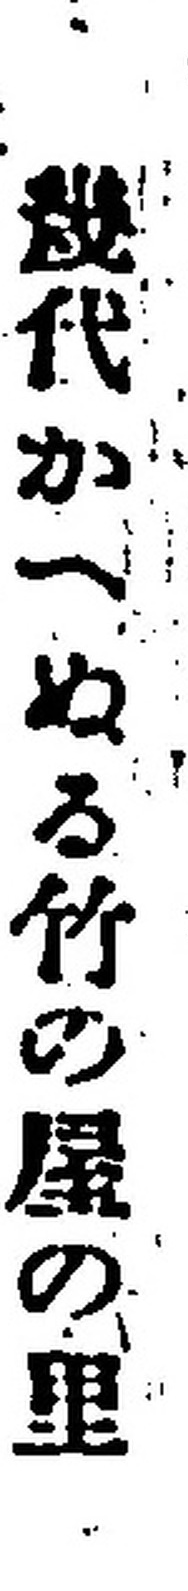幾代かへぬる竹の屋の里
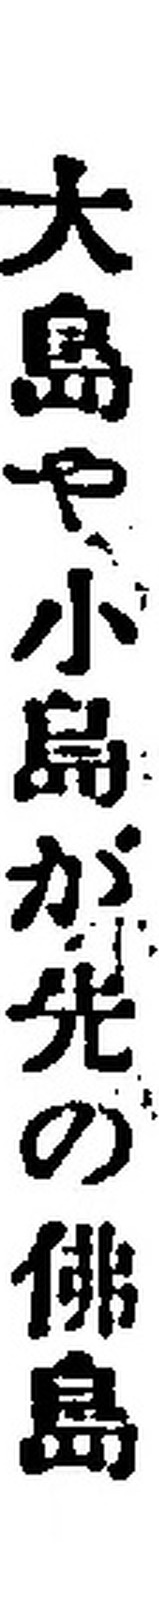大島や小島が先の仏島
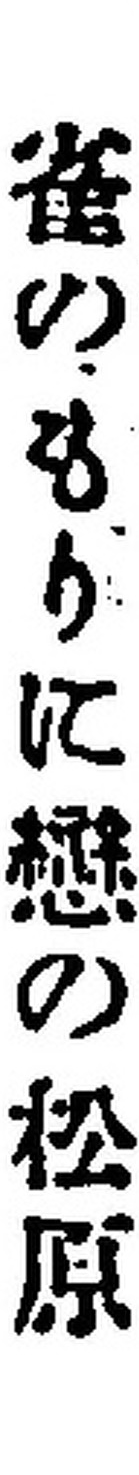雀のもりに恋の松原
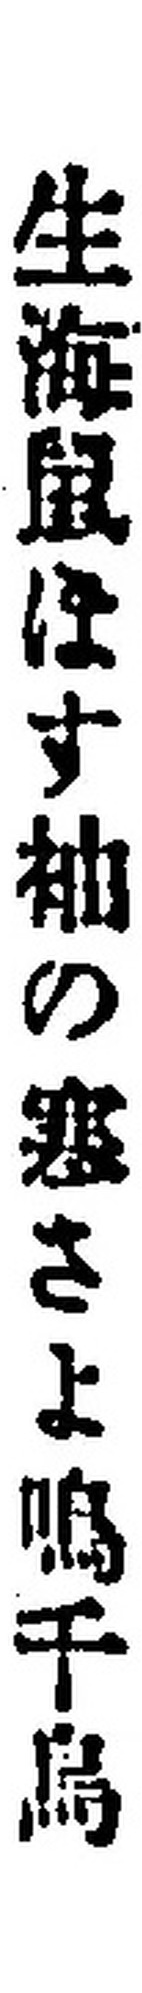生海鼠ほす袖の寒さよ鳴千鳥
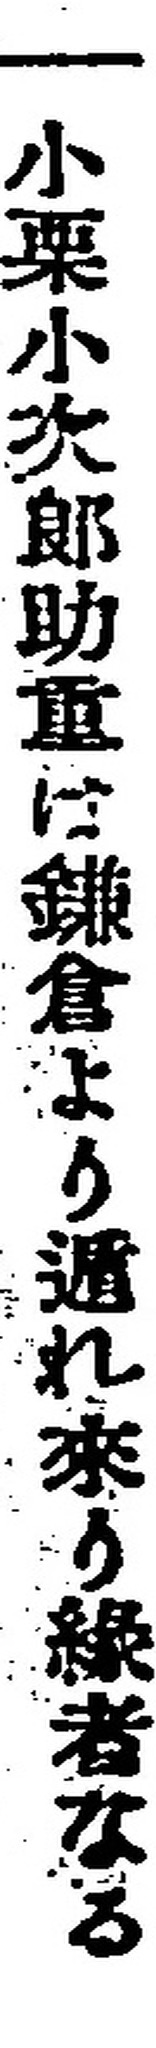小栗小次郎助重は鎌倉より遁れ来り縁者なる
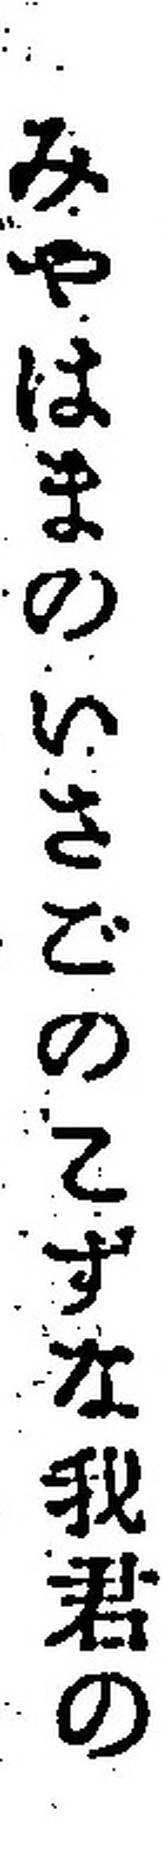みやはまのいさごのこずな我君の
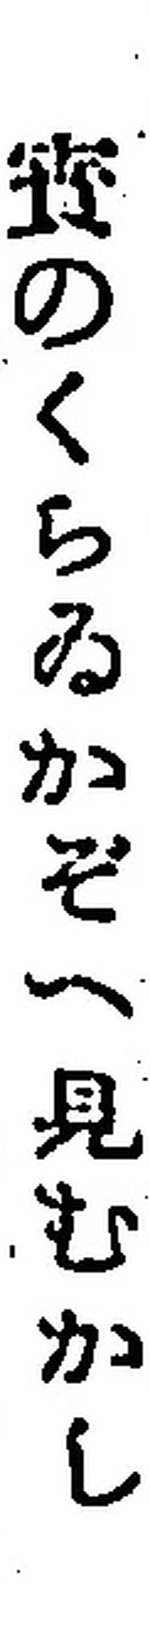宝のくらゐかぞへ見むかし
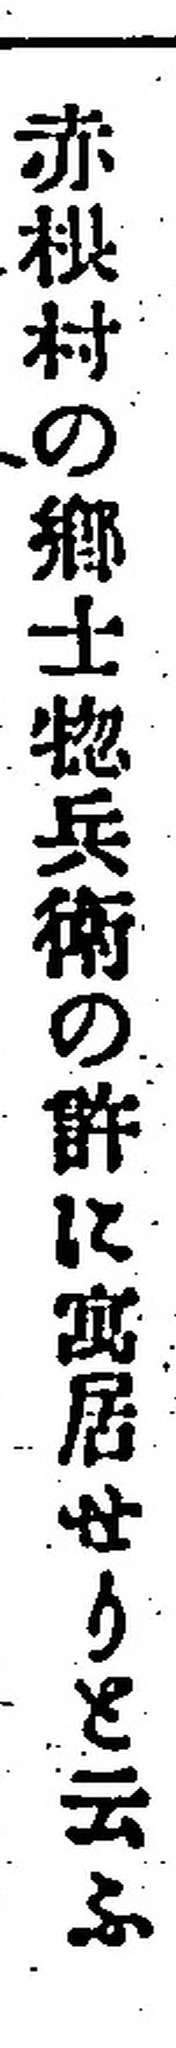赤根村の郷士惣兵衛の許に寓居せりと云ふ
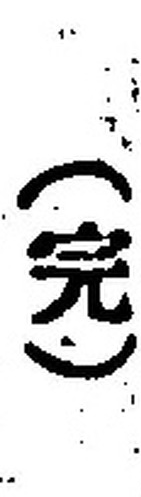(完)
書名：東参名勝案内
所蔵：国立国会図書館 National Diet Library, JAPAN
